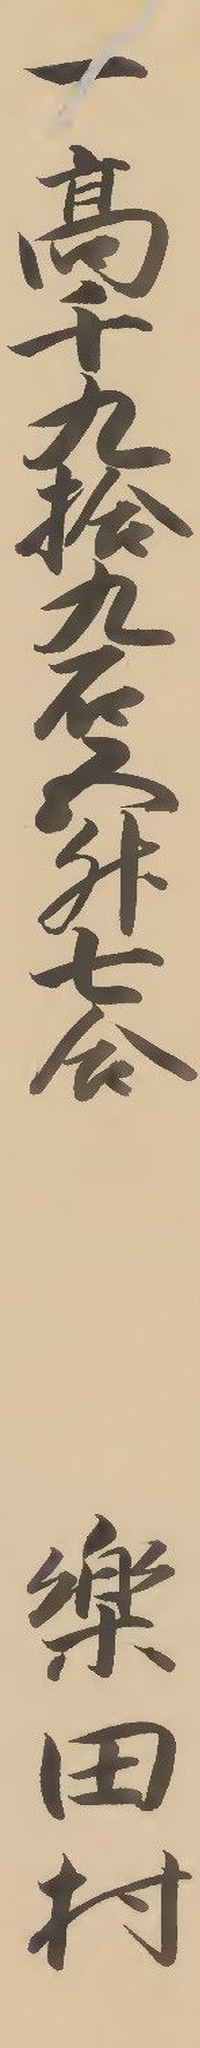一高千九拾九石五升七合楽田村
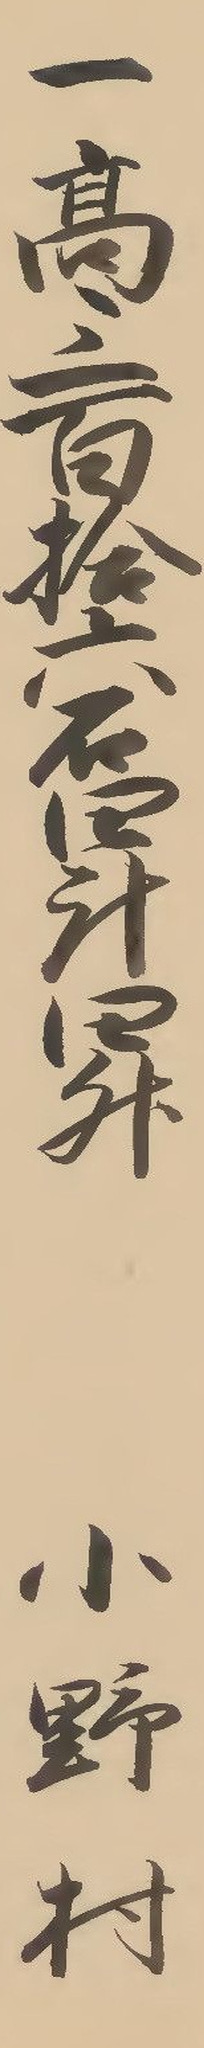一高三百拾六石四斗四升小野村
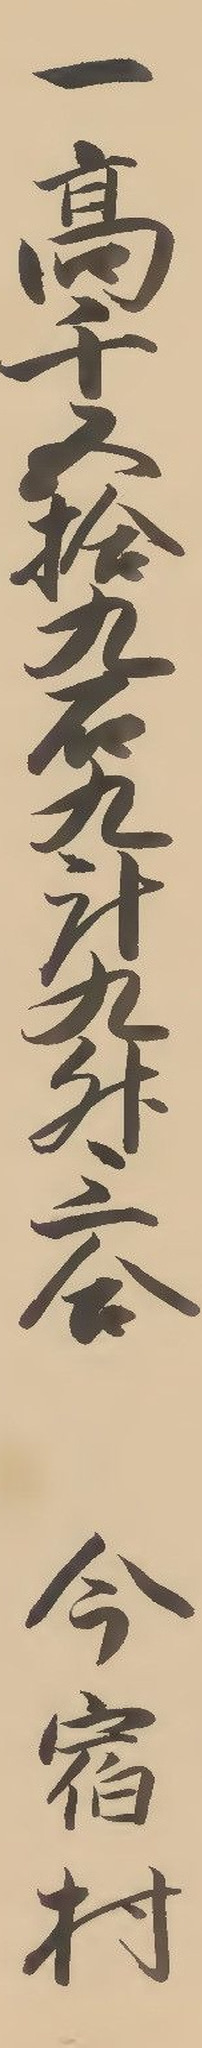一高千五拾九石九斗九升三合今宿村
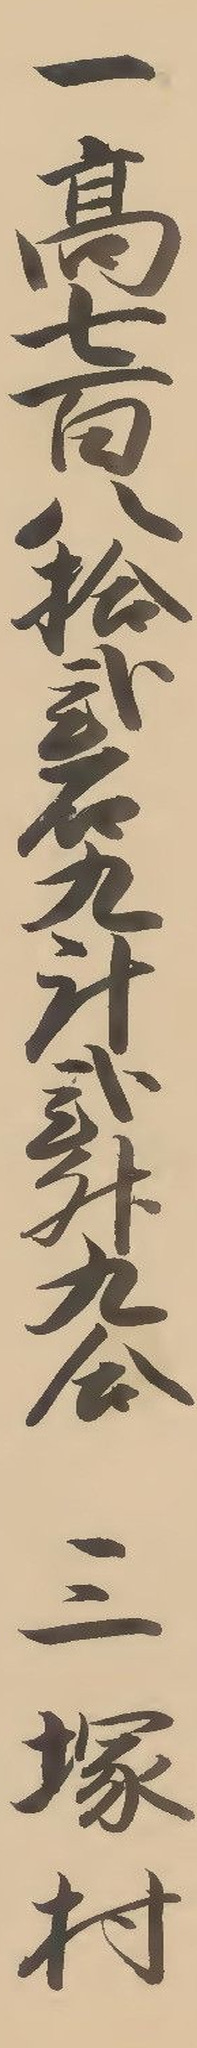一高七百八拾弐石九斗弐升九合三塚村
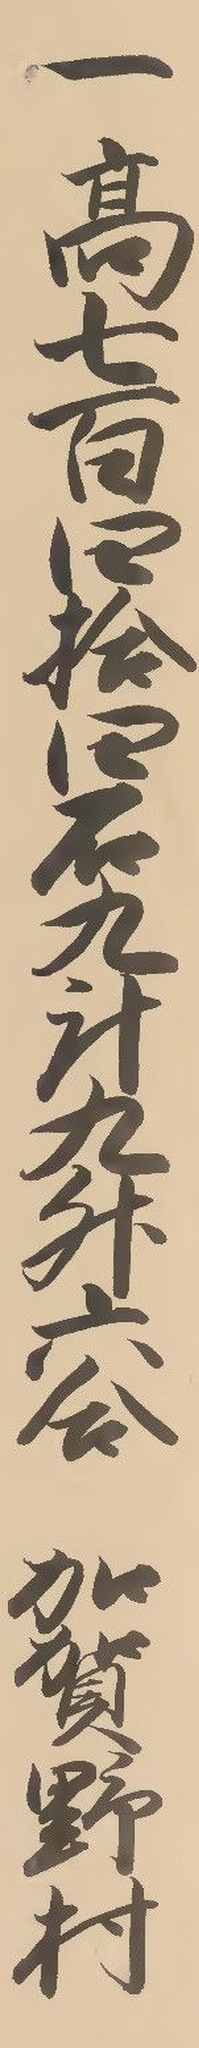一高七百四拾四石九斗九升六合加賀野村
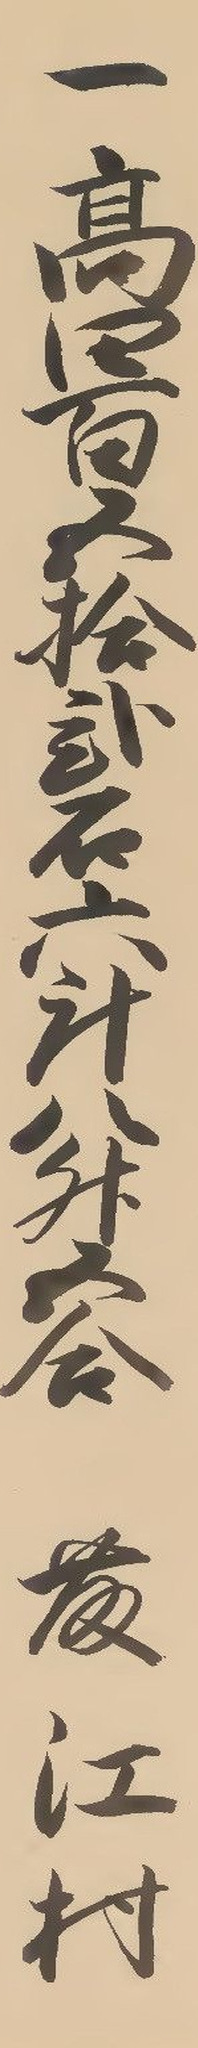一高四百五拾弐石六斗八升五合藤江村
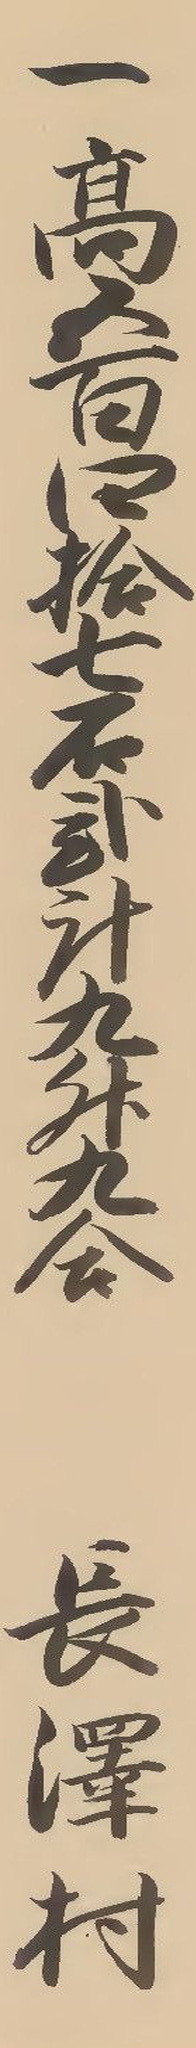一高五百四拾七石弐斗九升九合長沢村
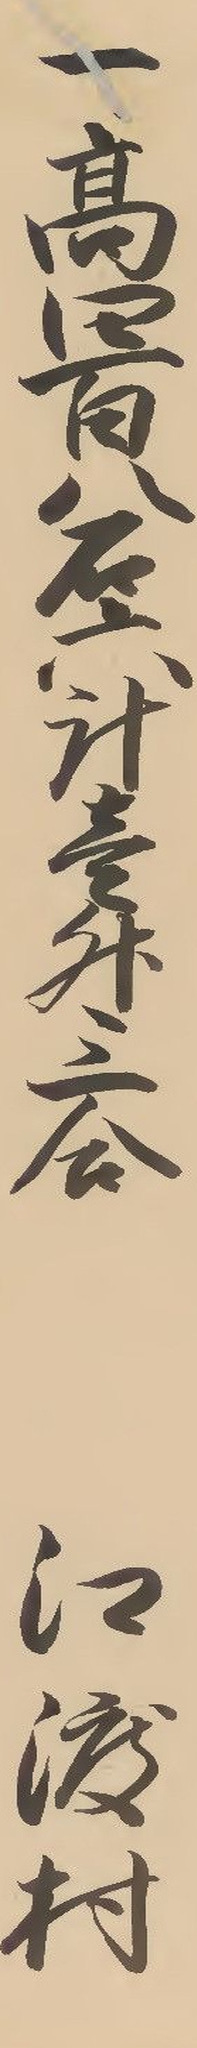一高四百八石六斗壱升三合江渡村

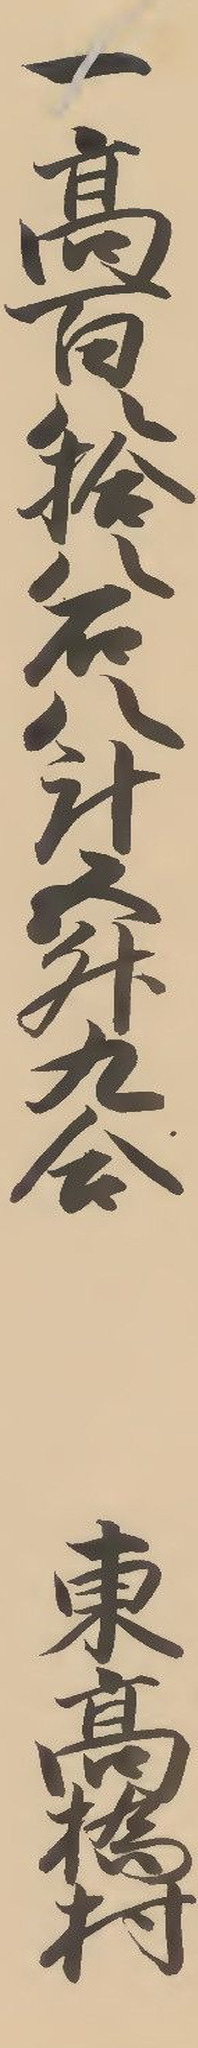一高百八拾八石八斗五升九合東高橋村
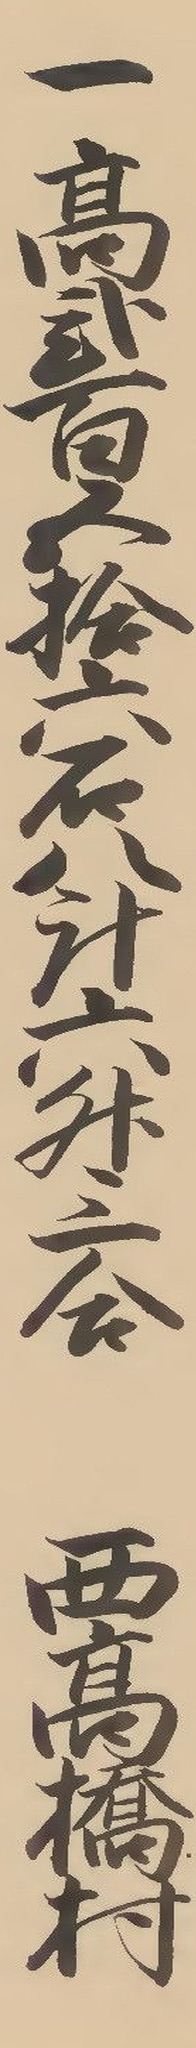一高弐百五拾六石八斗六升三合西高橋村
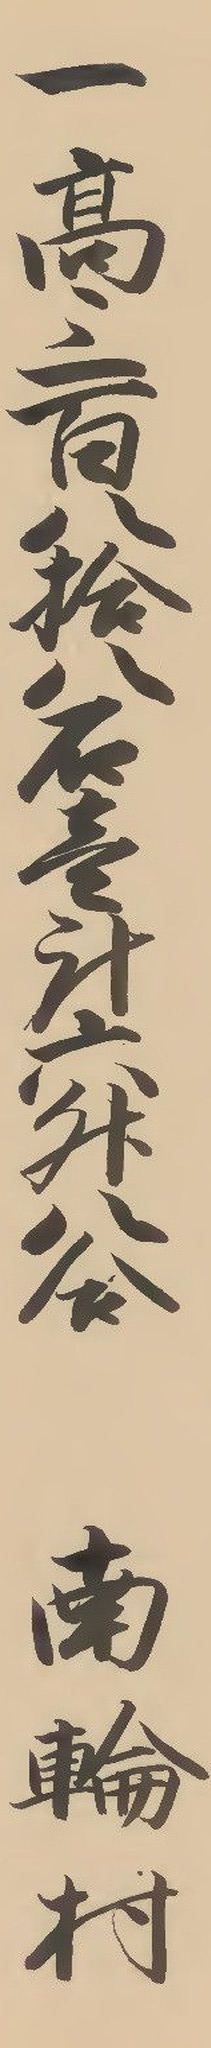一高三百八拾八石壱斗六升八合南輪村
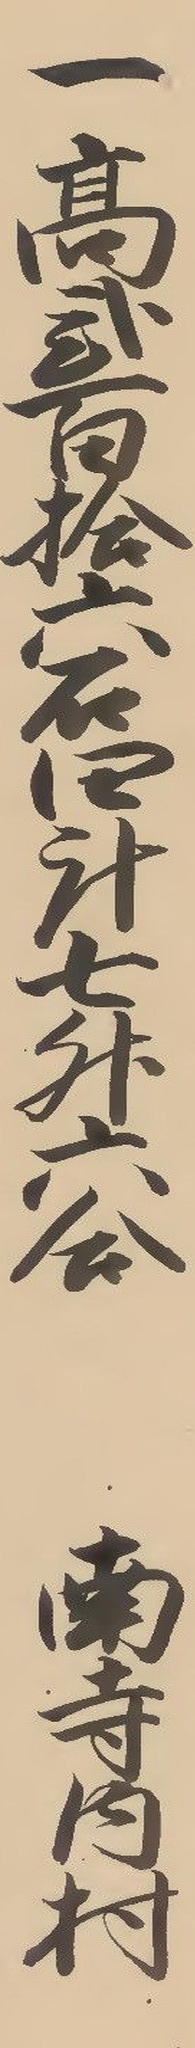一高弐百拾六石四斗七升六合南寺内村
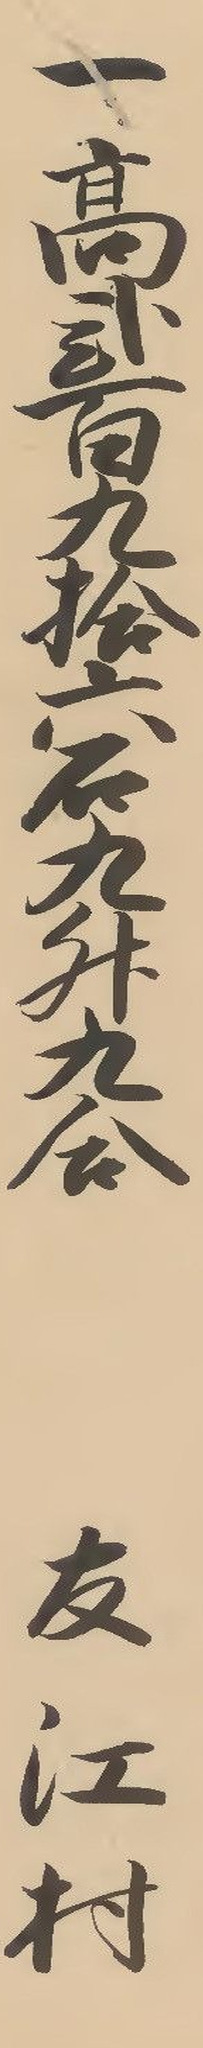一高弐百九拾六石九升九合友江村

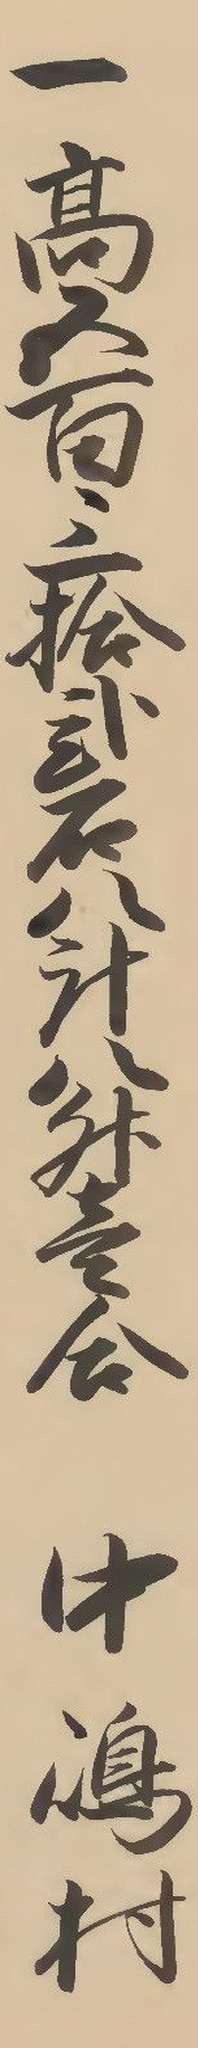一高五百三拾弐石八斗八升壱合中島村
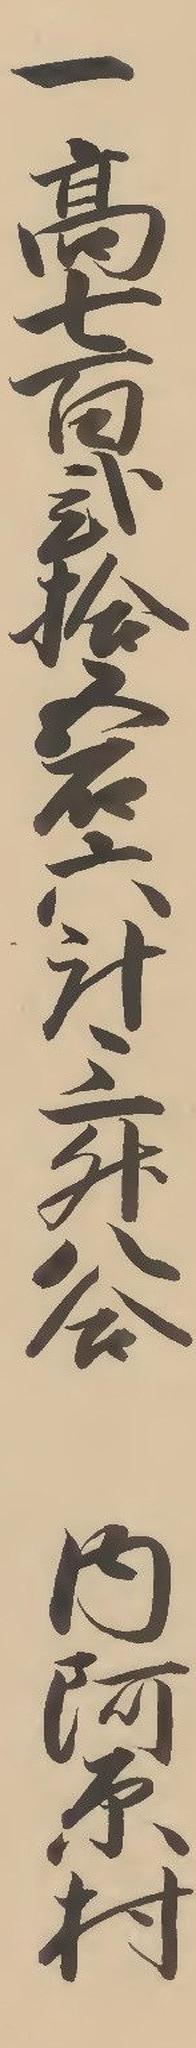一高七百弐拾五石六斗三升八合内阿原村
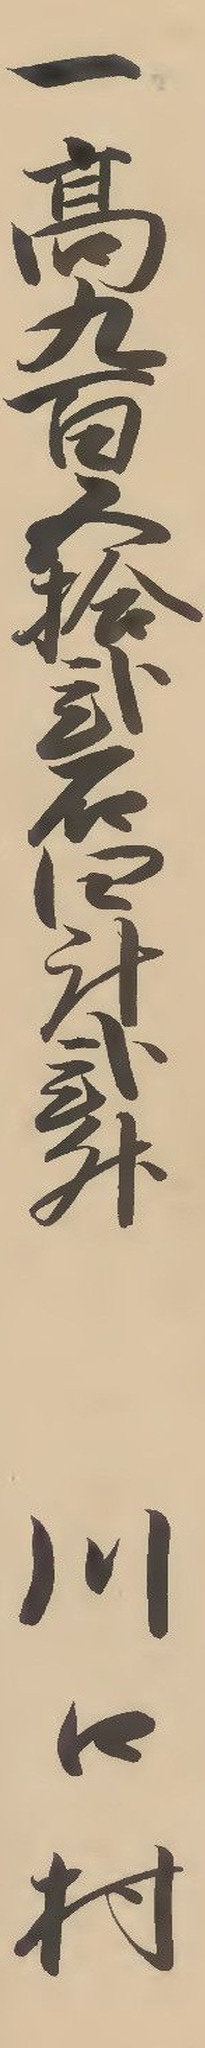一高九百五拾弐石四斗弐升川口村
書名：美濃国郷帳
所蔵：国立公文書館 National Archives of Japan
